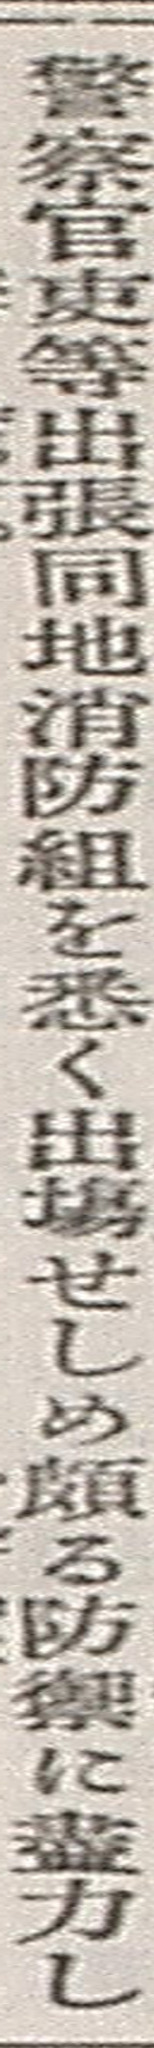警察官吏等出張同地消防組を悉く出場せしめ頗る防禦に尽力し
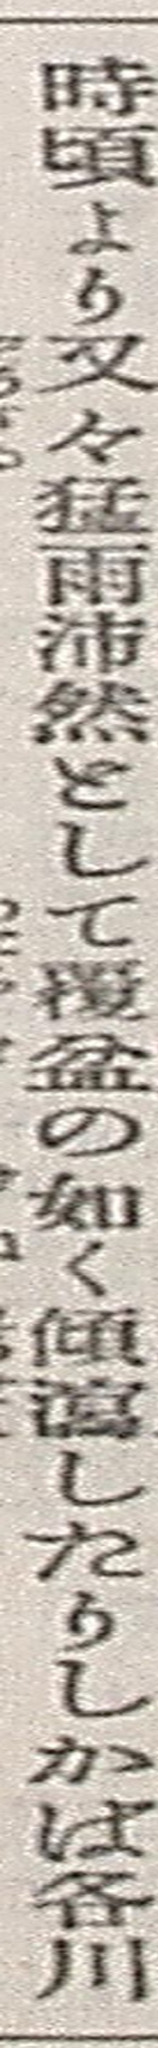時頃より又々猛雨沛然として覆盆の如く傾瀉したりしかば各川
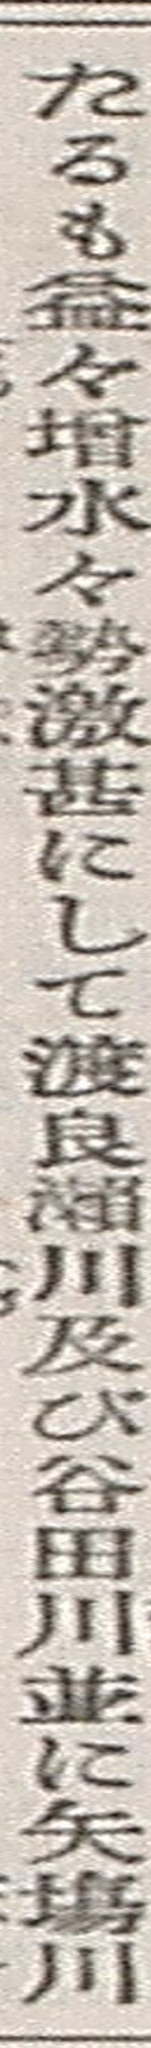たるも益々増水々勢激甚にして渡良瀬川及び谷田川並に矢場川
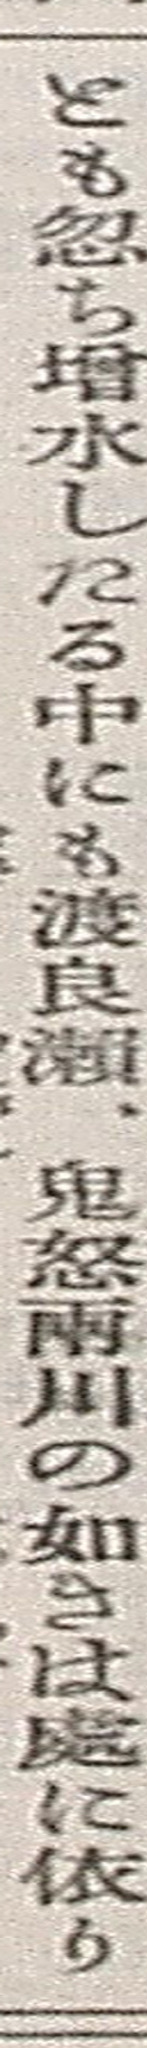とも忽ち増水したる中にも渡良瀬、鬼怒両川の如きは処に依り
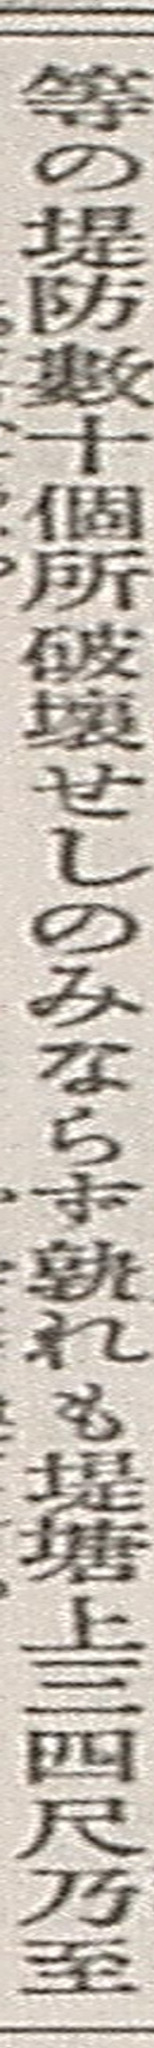等の堤防数十個所破壊せしのみならず孰れも堤塘上三四尺乃至
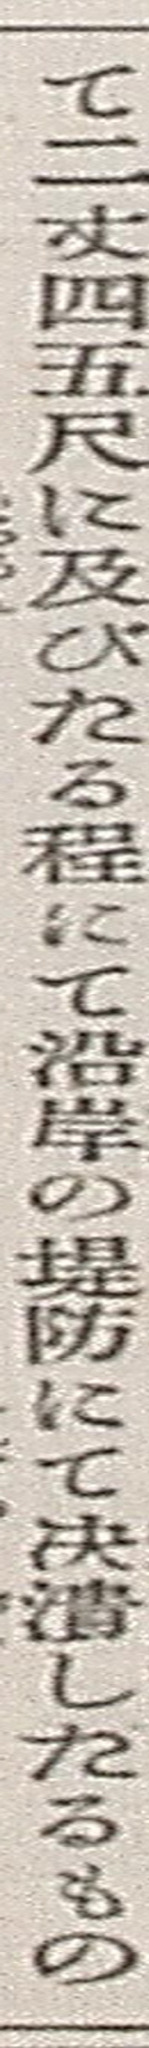て二丈四五尺に及びたる程にて沿岸の堤防にて决潰したるもの
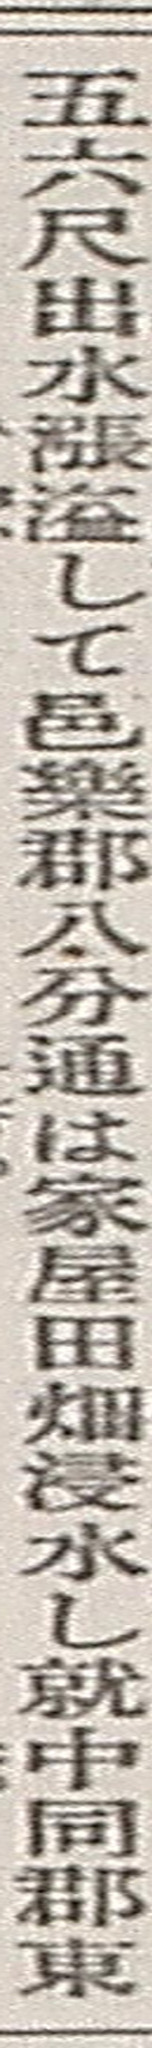五六尺出水漲溢して邑楽郡八分通は家屋田畑浸水し就中同郡東
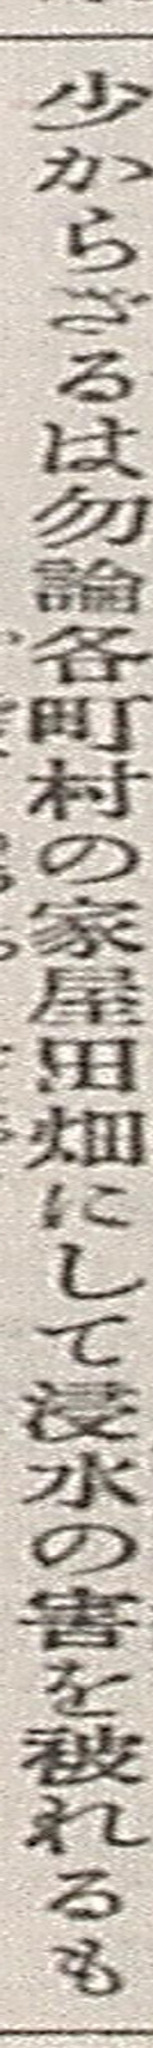少からざるは勿論各町村の家屋田畑にして浸水の害を被れるも
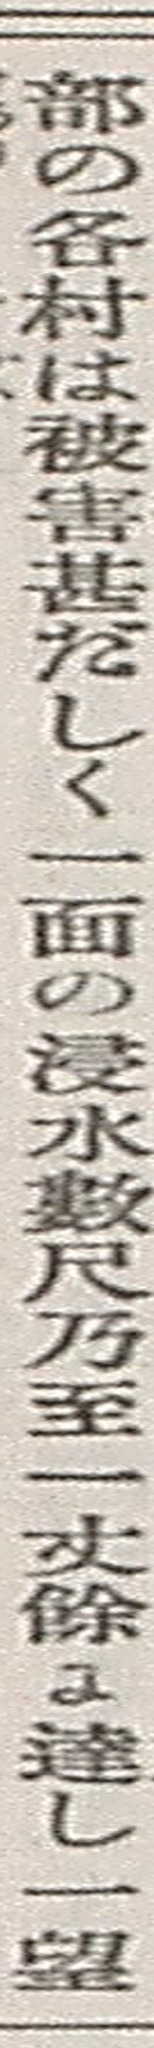部の各村は被害甚だしく一面の浸水数尺乃至一丈餘に達し一望
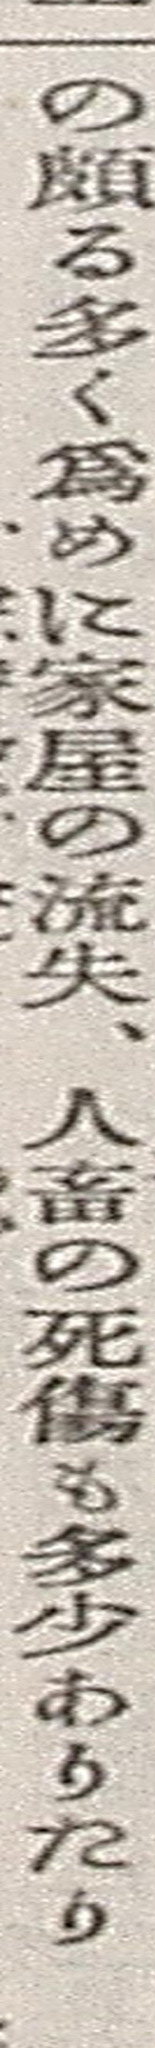の頗る多く為めに家屋の流失、人畜の死傷も多少ありたり
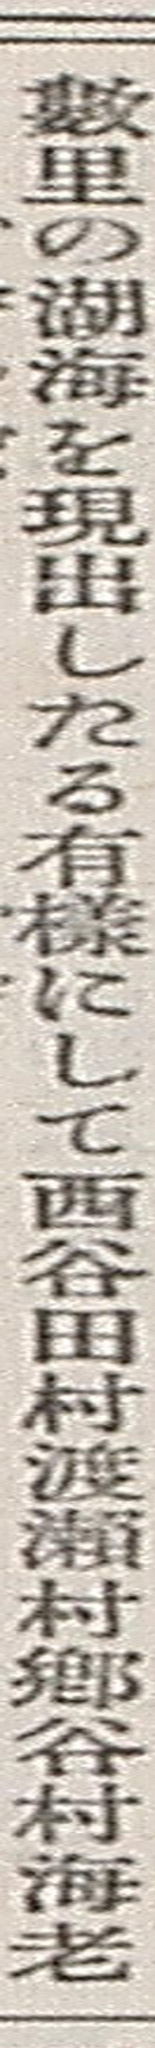数里の湖海を現出したる有様にして西谷田村渡瀬村郷谷村海老
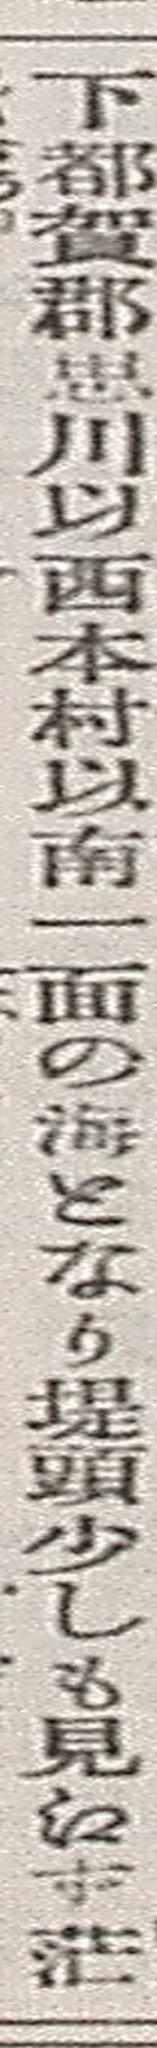下都賀郡思川以西本村以南一面の海となり提頭少しも見えず茫
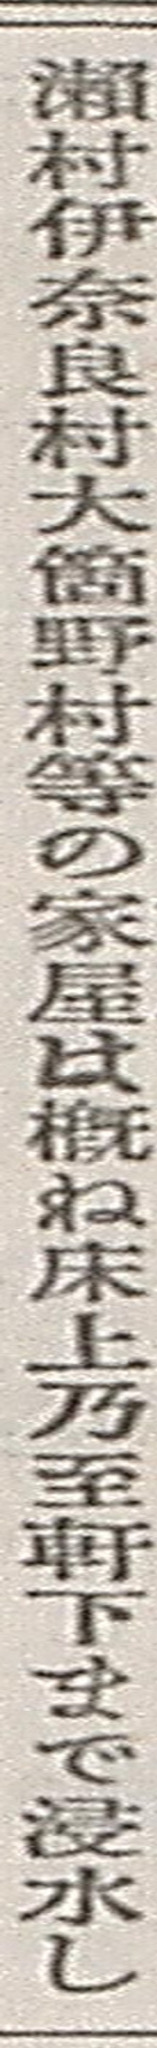瀬村伊奈良村大筒野村等の家屋は概ね床上乃至軒下まで浸水し
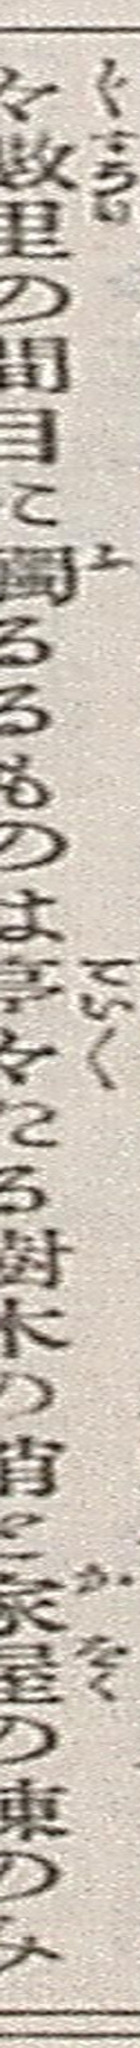々数里の間目に触るるものは亭々たる樹木の梢と家屋の棟のみ
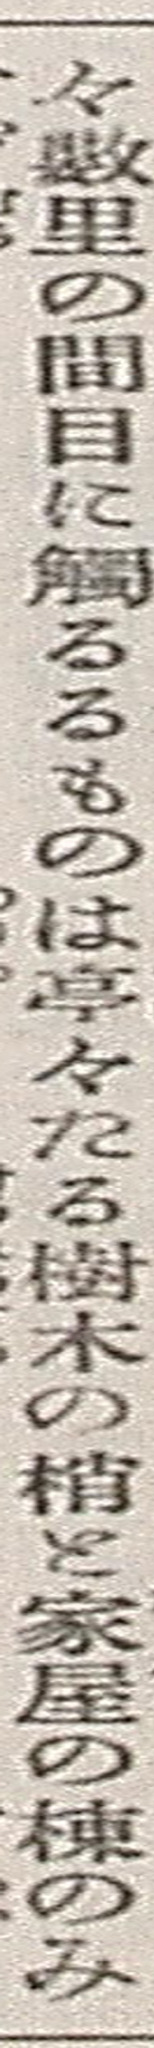々数里の間目に触るるものは亭々たる樹木の梢と家屋の棟のみ
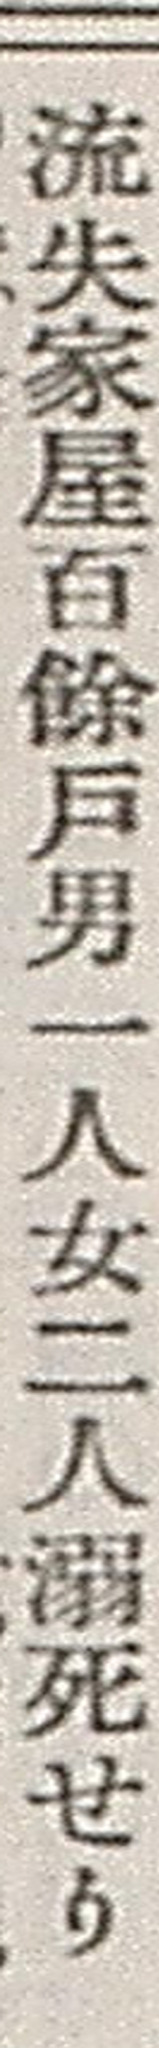流失家屋百餘戸男一人女二人溺死せり
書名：風俗畫報臨時増刊第百二十八號　洪水被害録（下）
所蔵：東京大学地震研究所図書室 Earthquake Research Institute Library, The University of Tokyo, JAPAN
